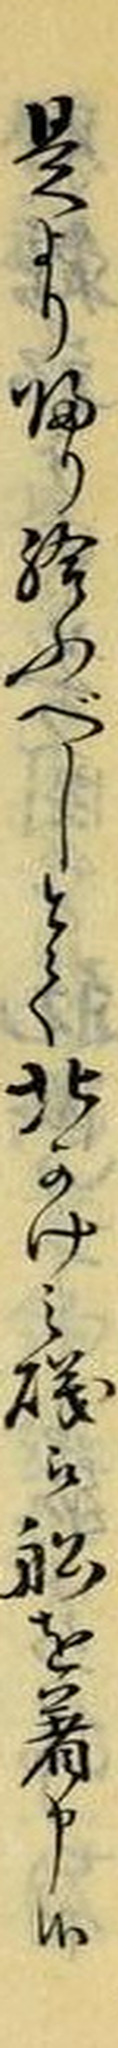是より帰り給ふべしとて北かけ之磯へ船を着申候
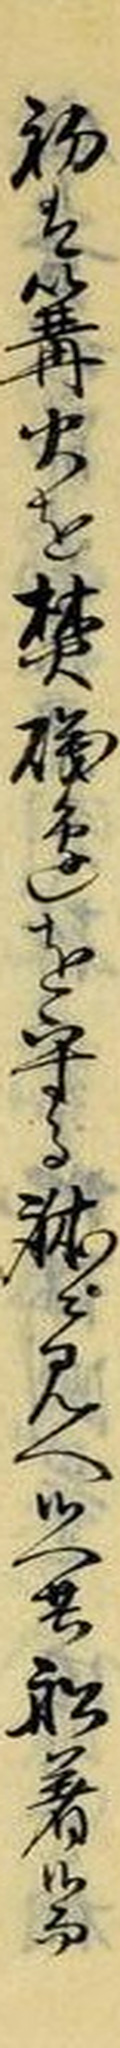初は篝火を焚磯辺を守る躰ニ見へ候へ共船着申候而
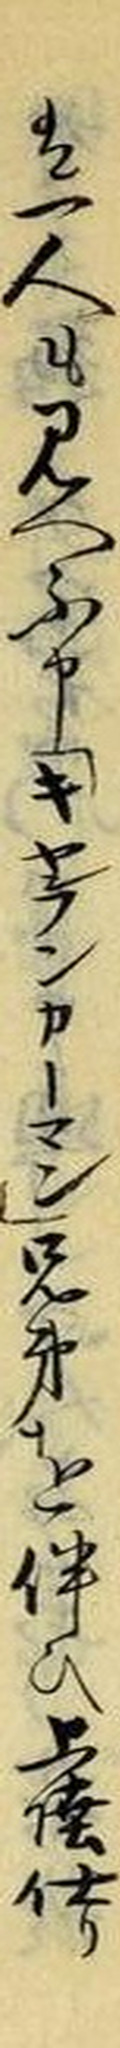は一人も見へ不申「キヤンフンカーマン」兄弟を伴ひ上陸仕り
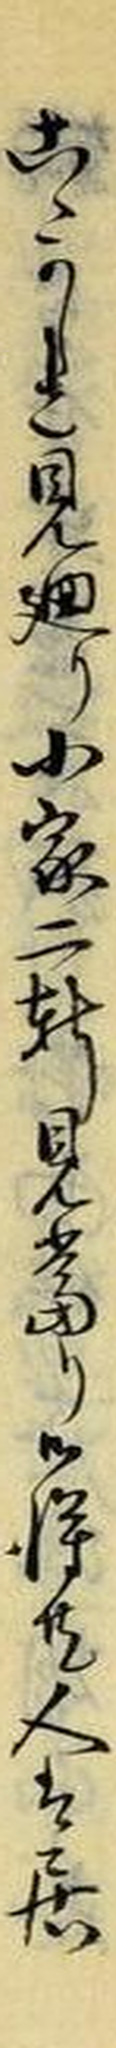こゝかれ見廻り小家二軒見当り候得共人は居
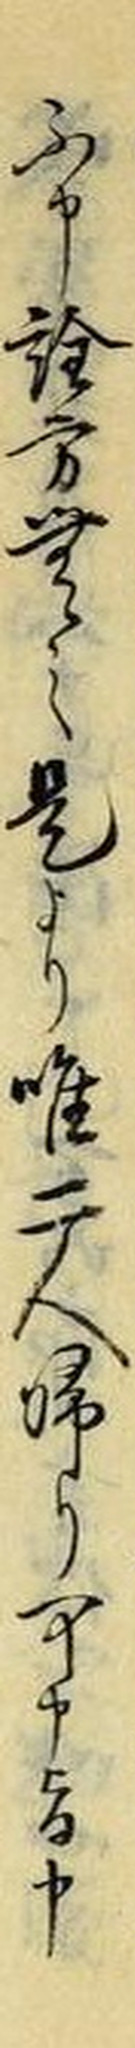不申詮方無之是より唯二人帰り可申旨申
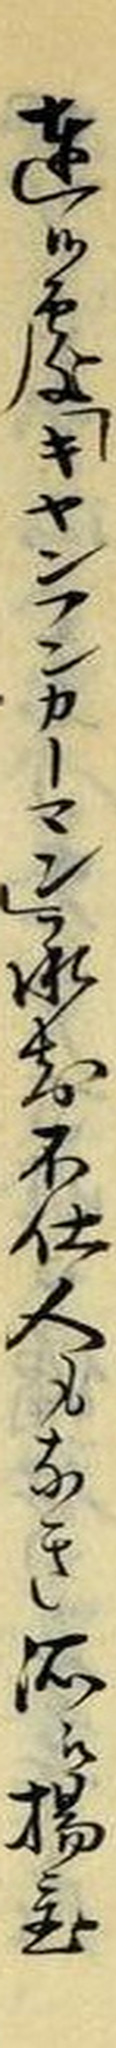達候處「キヤンフンカーマン」承知不仕人もなき所へ揚置
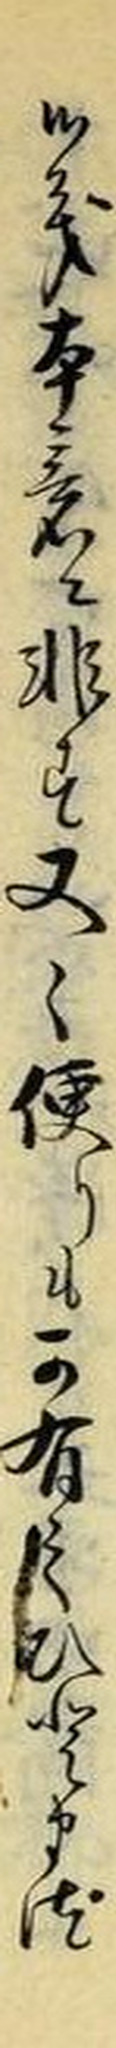候義本意ニ非す又々便りも可有之ひとます
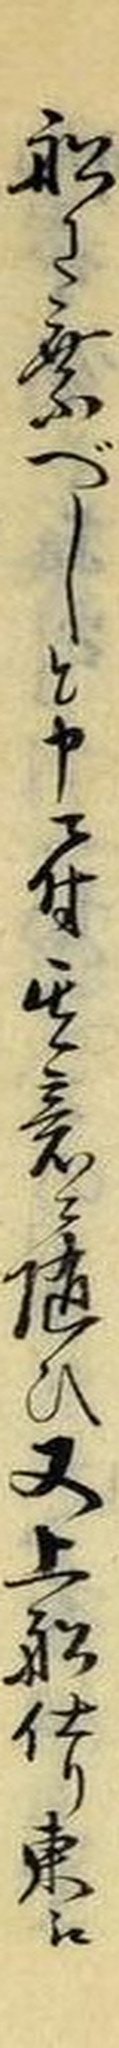船に乗べしと申ニ付其意ニ随ひ又上船仕り東へ
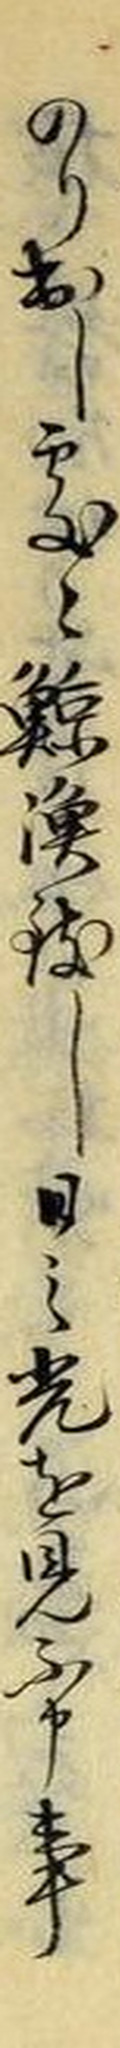のり出し處々鯨漁致し日之光を見不申事
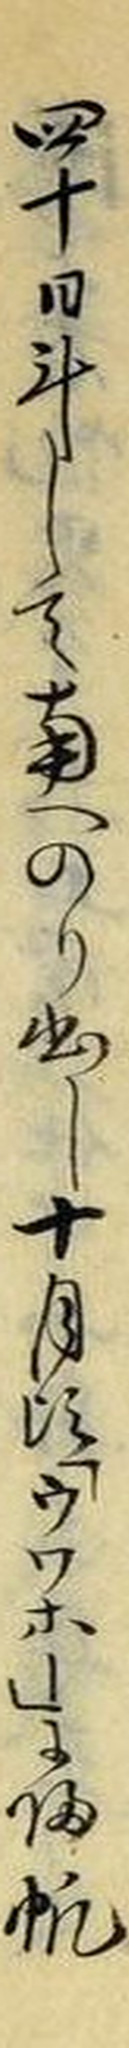四十日計して南へのり出し十月頃「ウワホー」に帰航
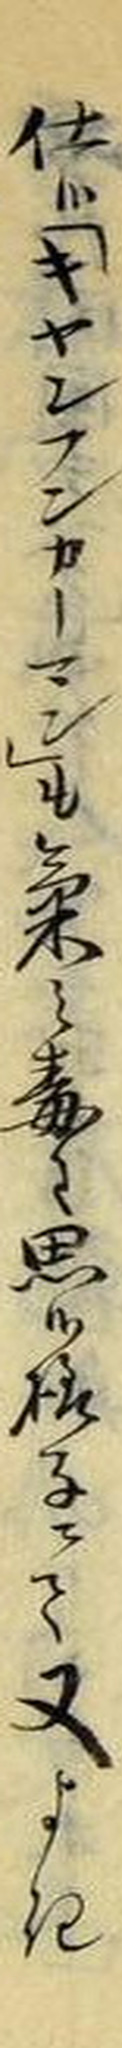仕候「キヤンフンカーマン」も気之毒に思候様子にて又よき
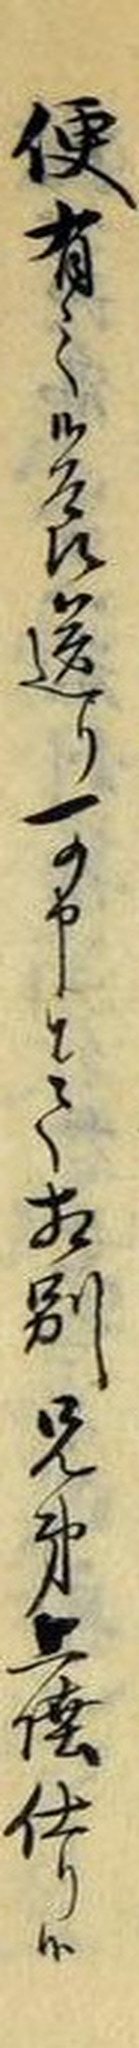便有之候節送り可申とて相別兄弟上陸仕り候

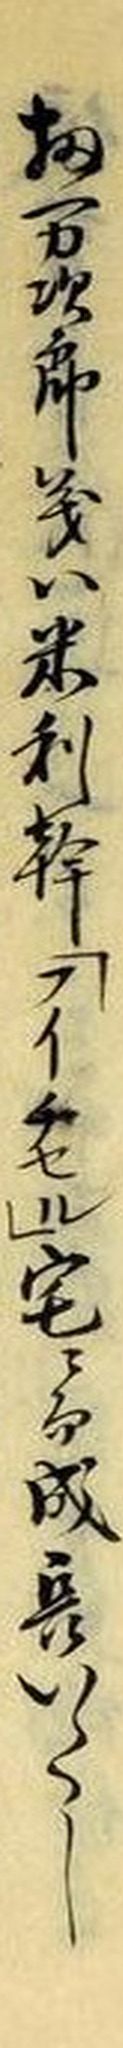扨万次郎義ハメリカ「フイチセル」宅ニ而成長いたし
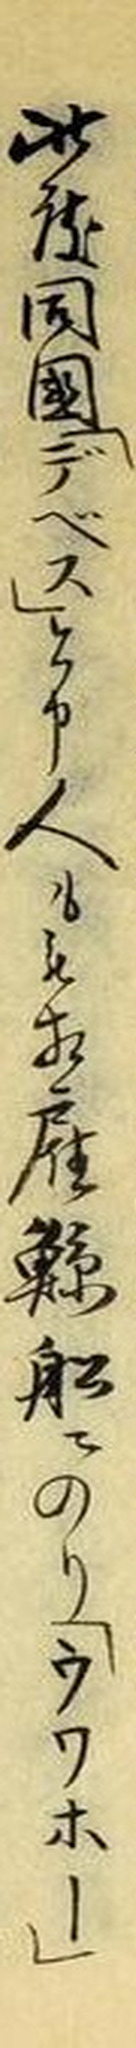此度同国「デべス」と申人もの相雇鯨船ニのり「ウワホー」
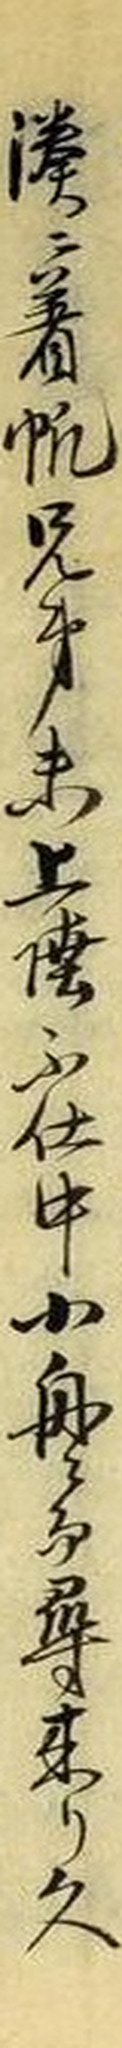湊ニ着帆兄弟未上陸不仕中小舟ニ而尋来り久
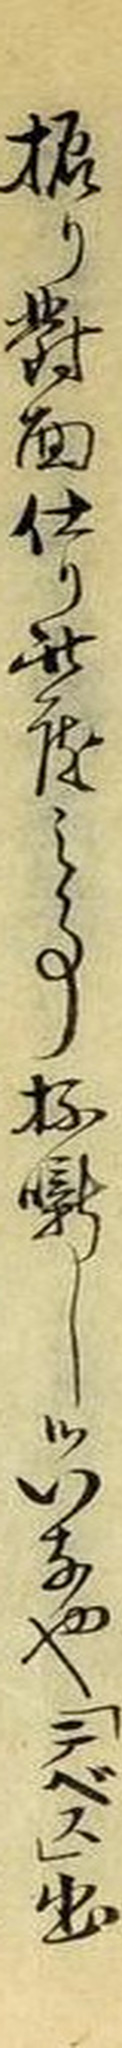振り対面仕り此度の事抔噺し候いなや「テべス」出
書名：漂客談奇（備考雑録写8）
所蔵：福井県文書館 Fukui Prefectural Archives
